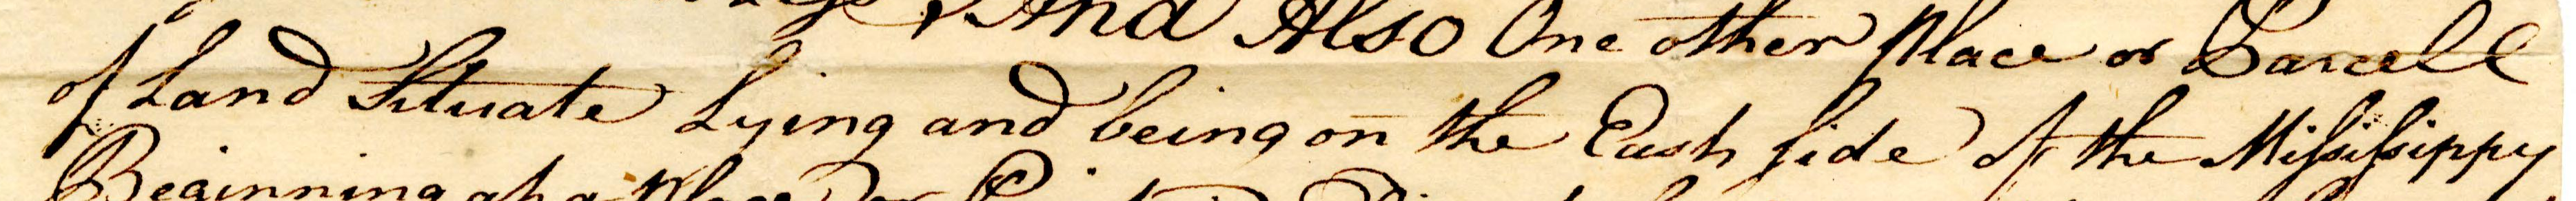of Land situate lying and being on the East side of the Mississippy
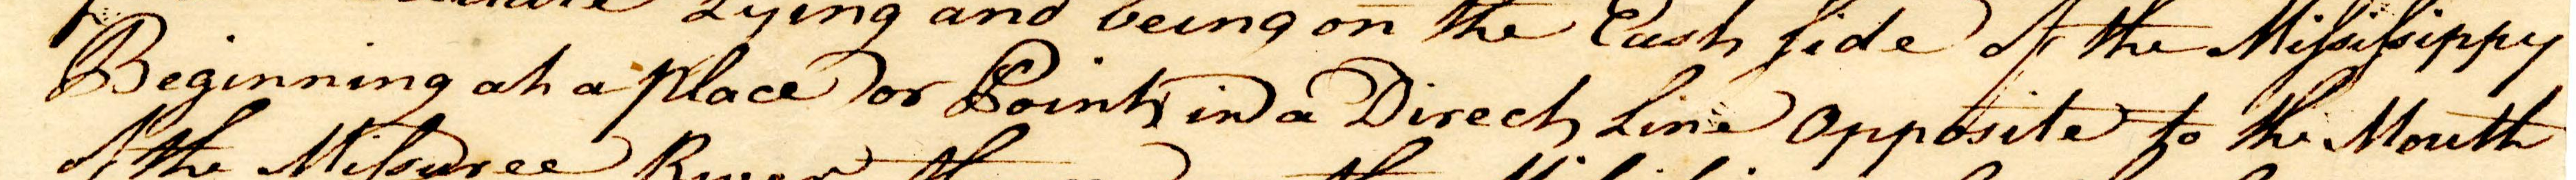Beginning at a place or Point in a Direct line opposite to the Mouth
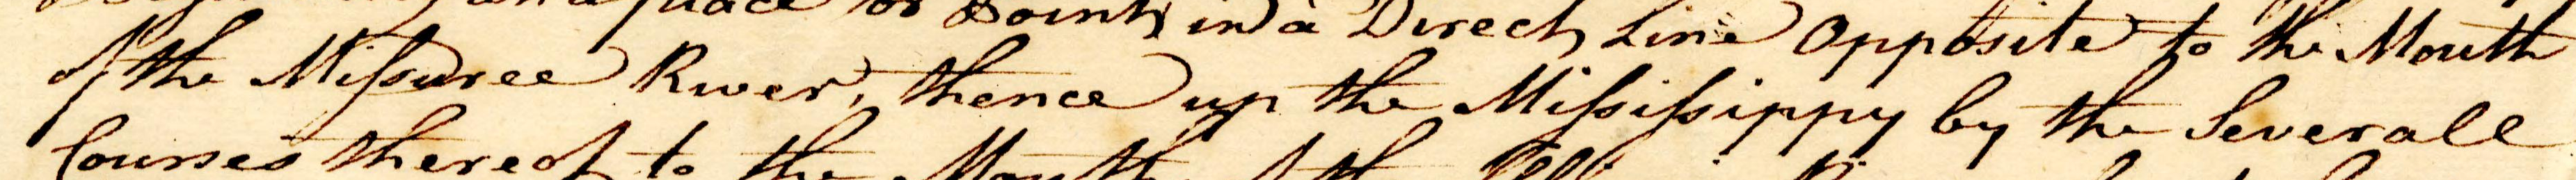of the Missuree River, thence up the Mississippy by the Severall
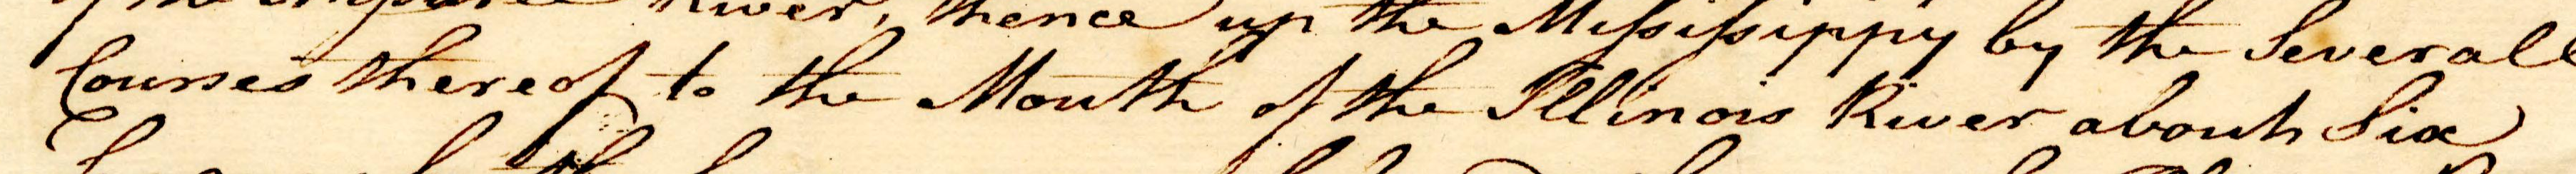Courses thereof to the Mouth of the Illinois River about Six
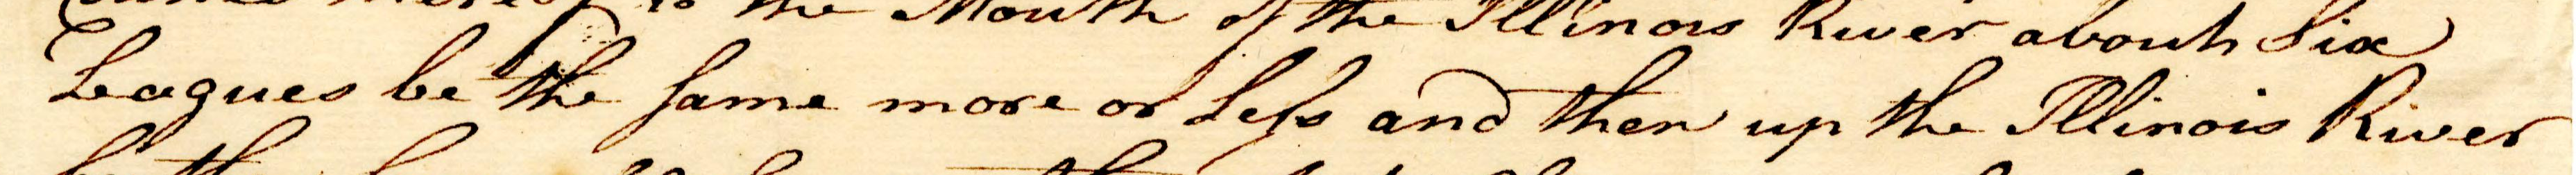Leagues be the same more or Less and then up the Illinois River
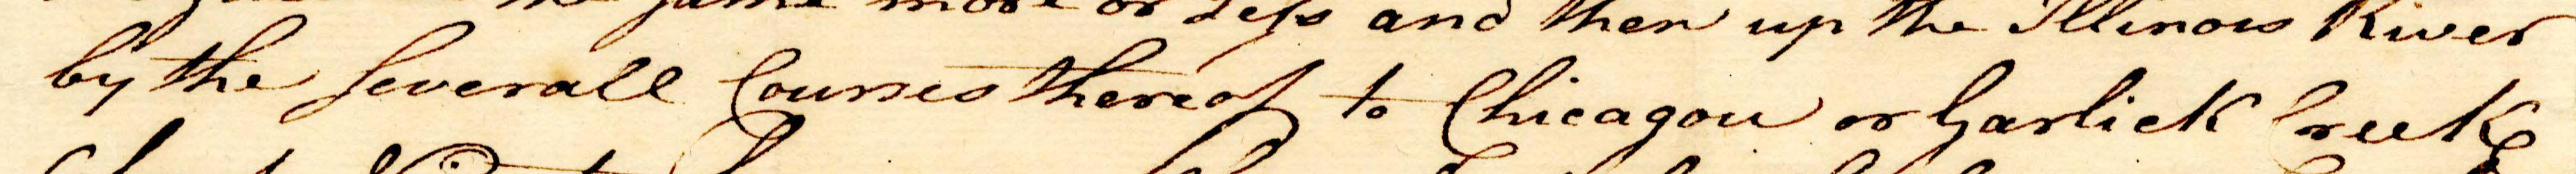by the severall Courses thereof to Chicagou or Garlick Creek
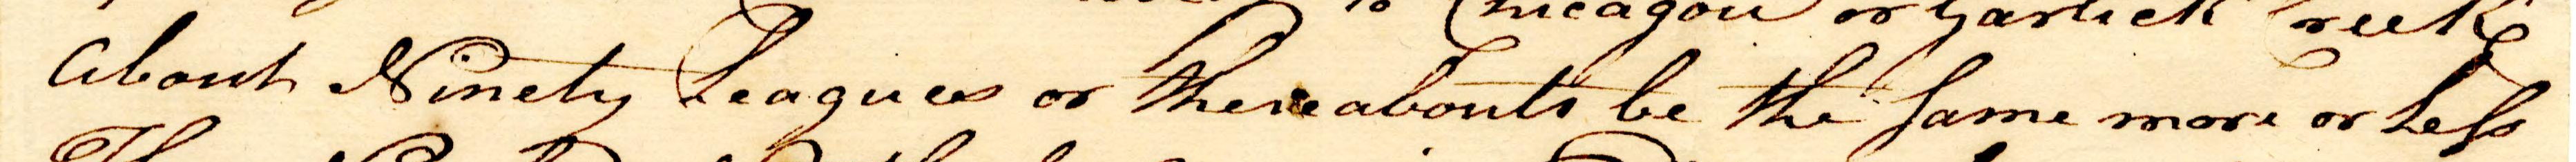about Ninety Leagues or thereabouts be the same more or less
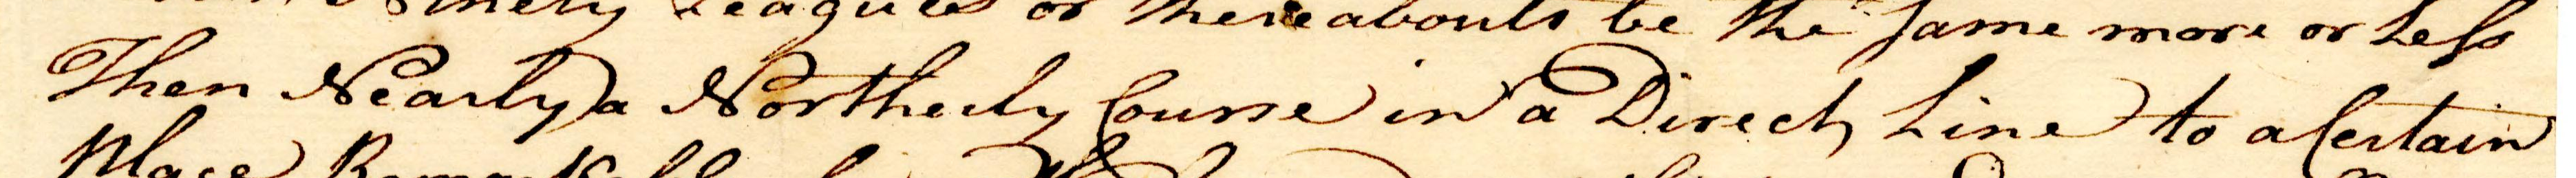Then nearly a Northerly course in a Direct line to a certain
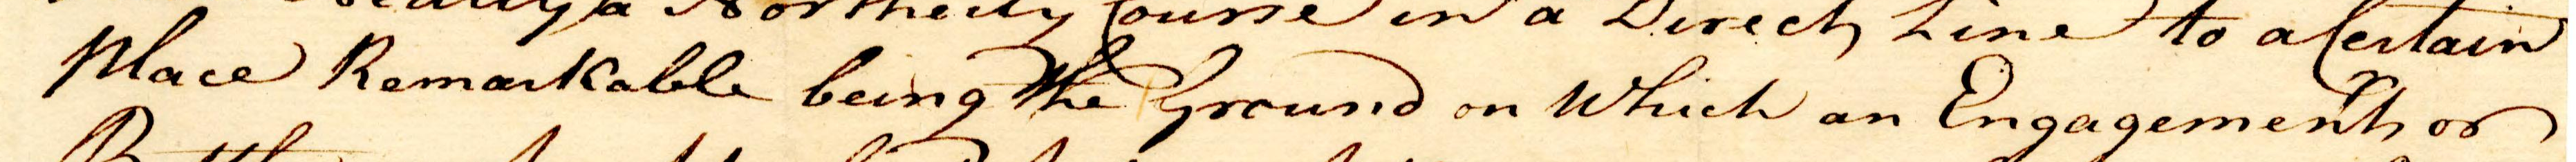place Remarkable being the Ground on Which an Engagements or
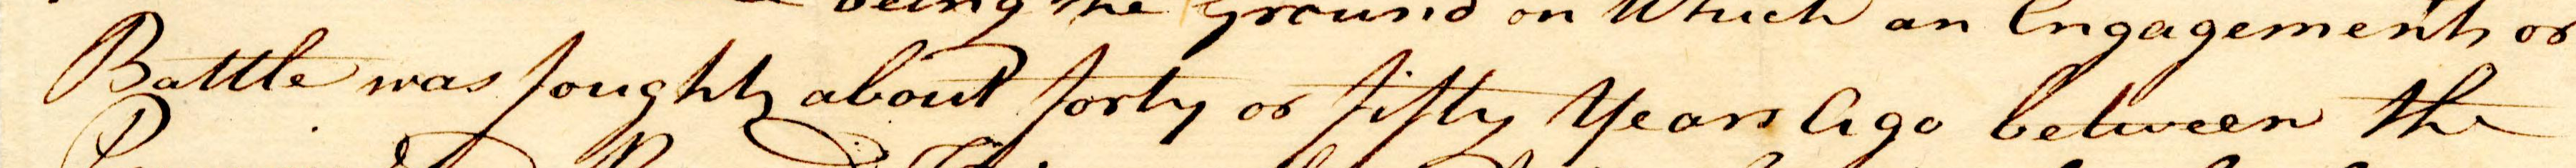Battle was fought about forty or fifty Year ago between the
